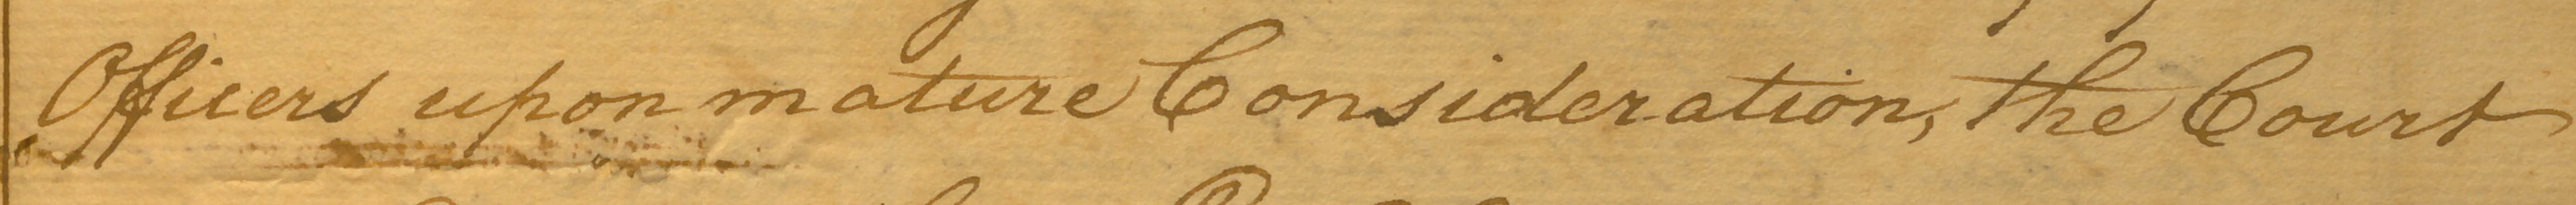Officers upon mature Consideration, the Court
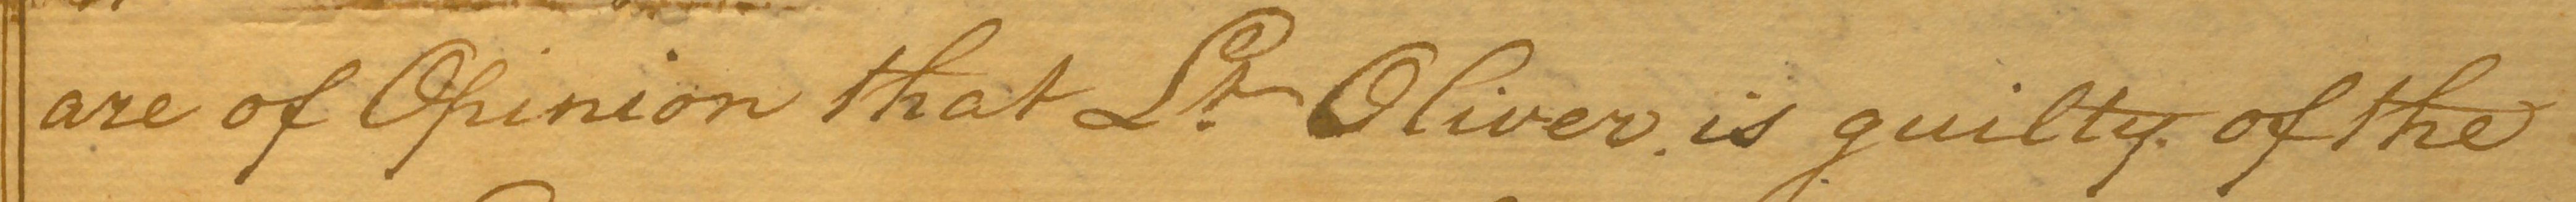are of Opinion that L^t. Oliver. is guilty of the
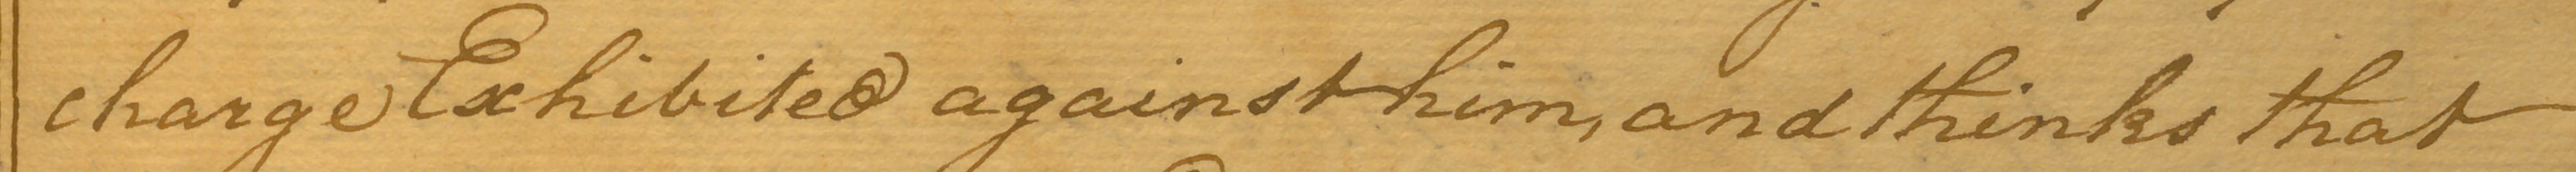charge Exhibited against him, and thinks that
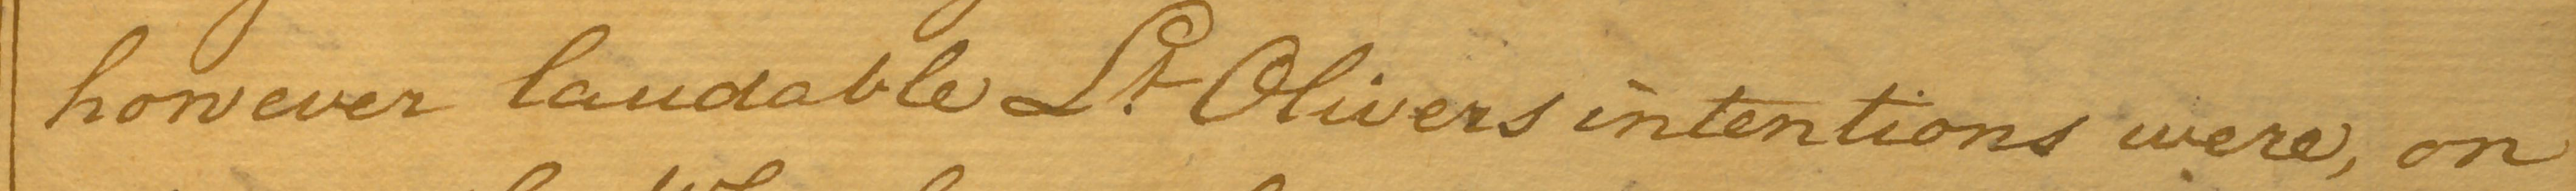however laudable L^t. Olivers intentions were, on
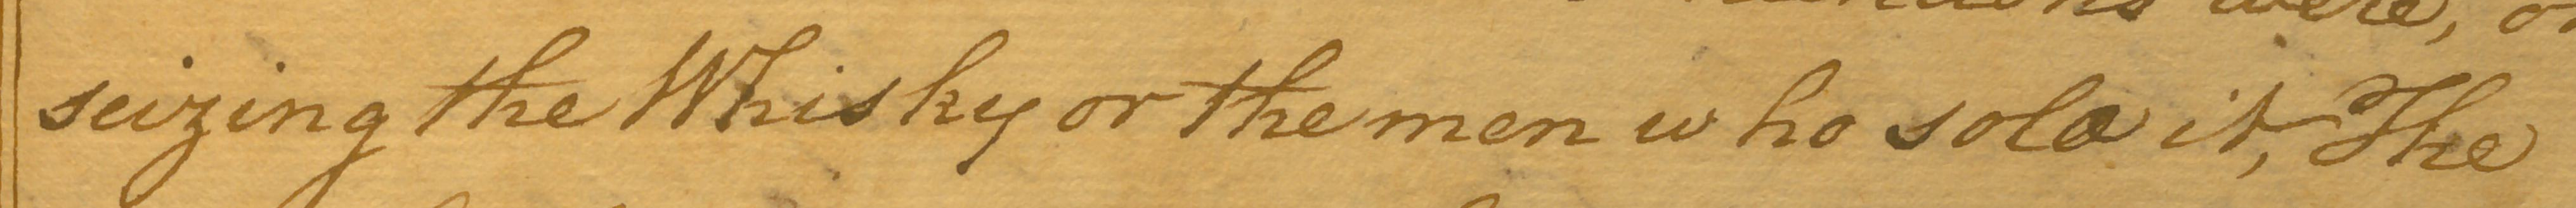seizing the Whisky or the men who sold it, The
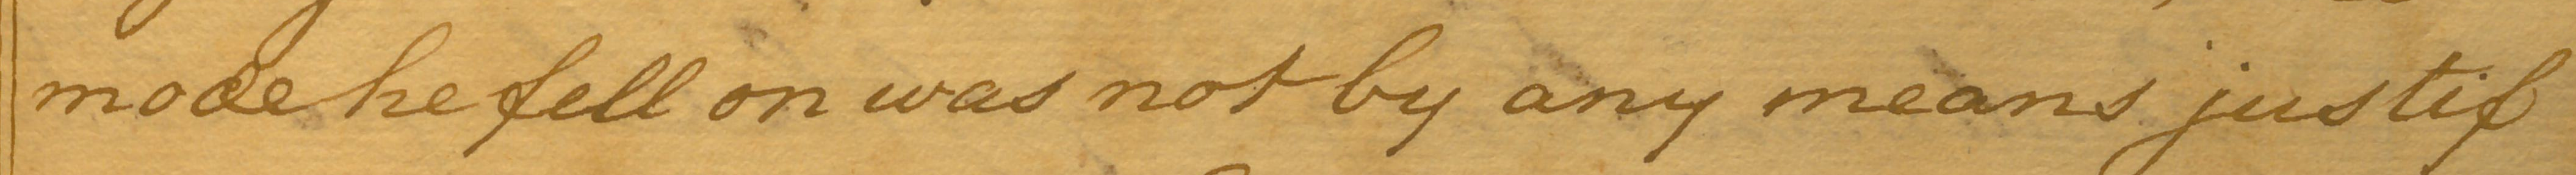mode he fell on was not by any means justif
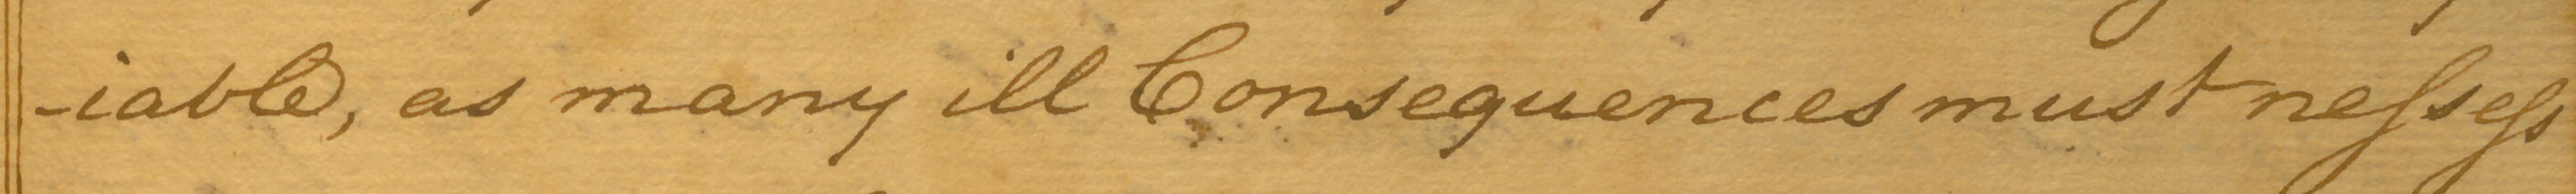-iable, as many ill Consequences must nessess
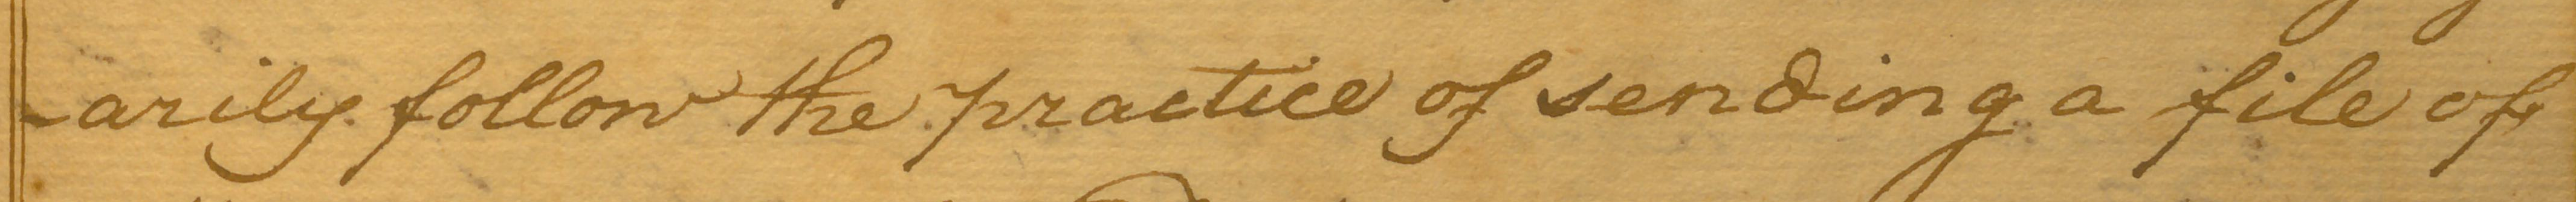-arily follow the practice of sending a file of
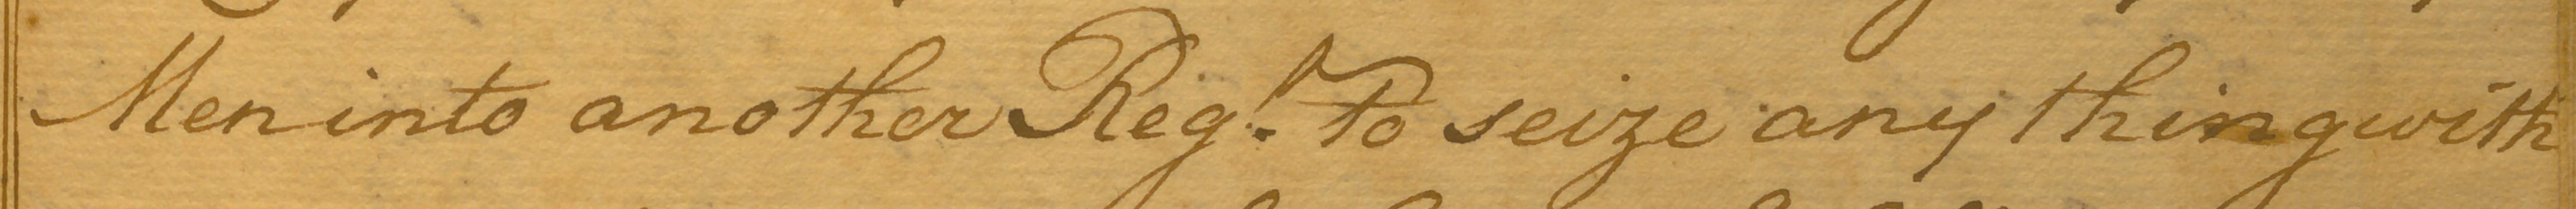Men into another Reg^t. to seize anything with
